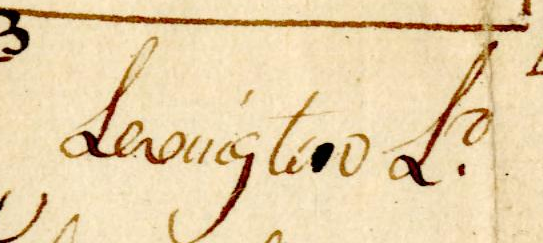Lexington L^d
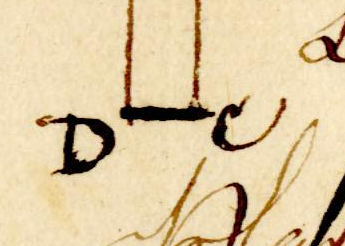D C
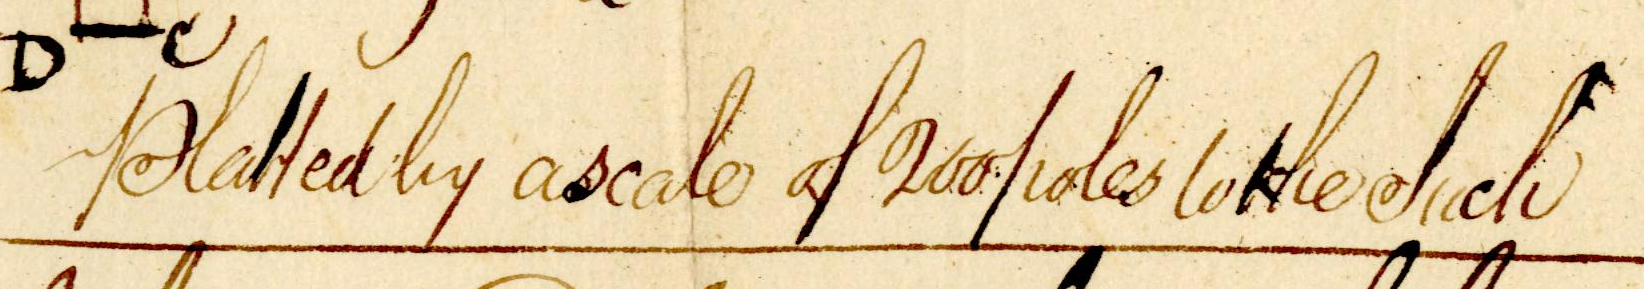platted by a scale of 200 poles to the Such
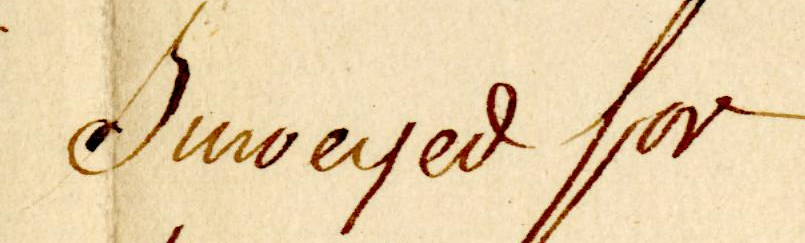Surveyed for
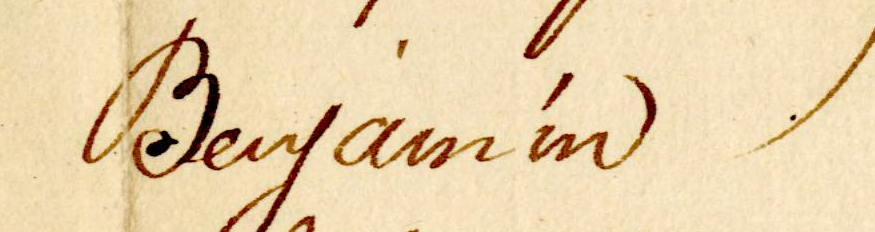Benjamin
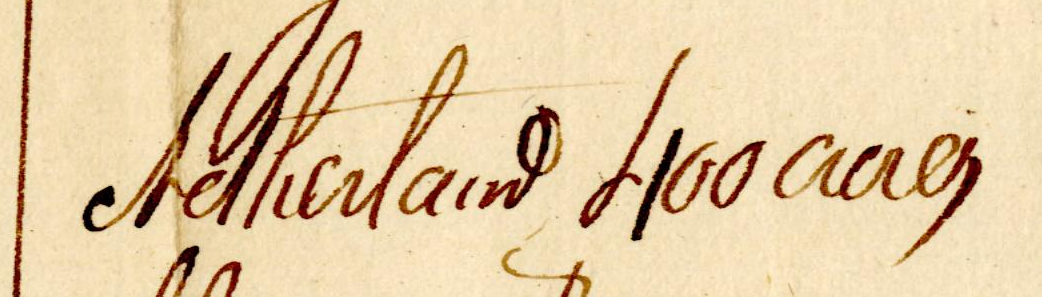Sellerland 400 acres
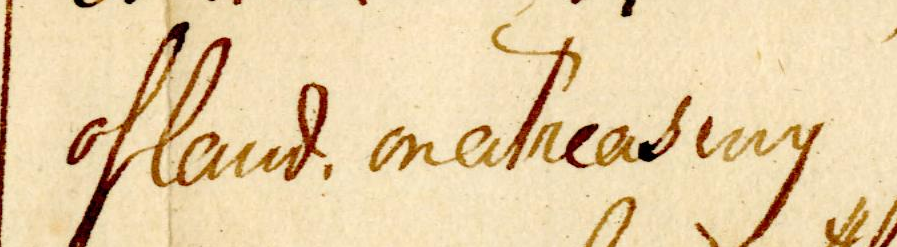of land in a treasury
